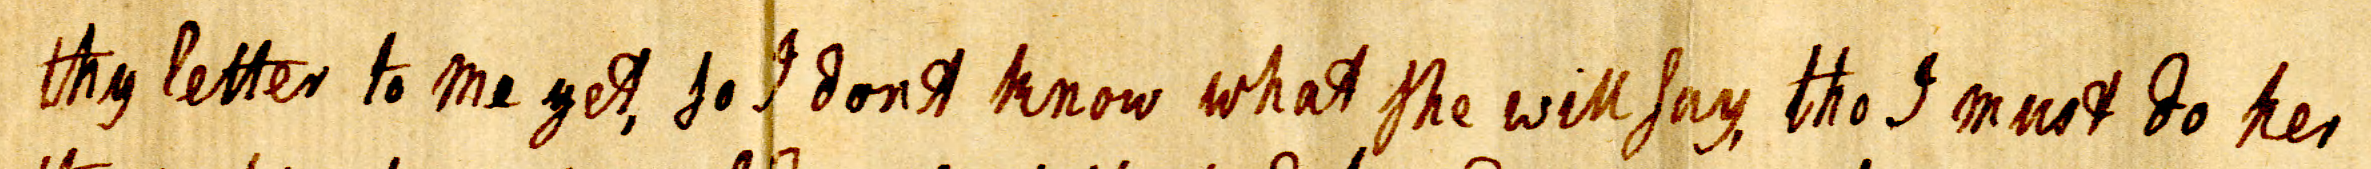thy letter to me yet, so I don’t know what she will say, tho I must do her
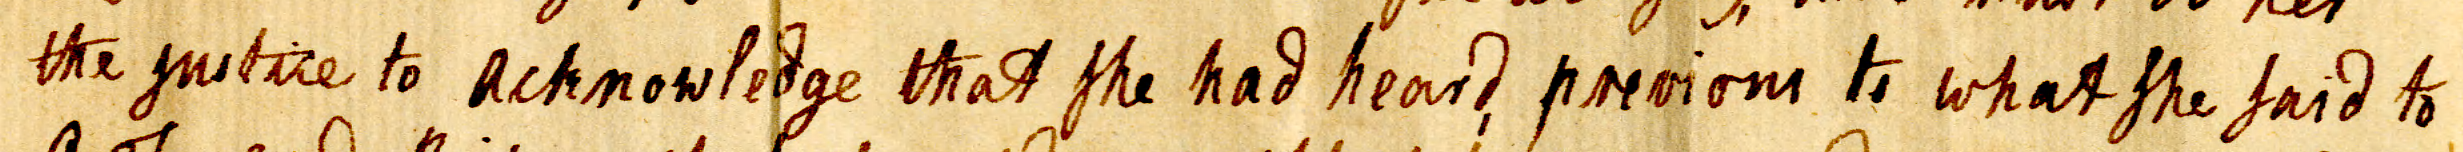the justice to acknowledge that she had heard, previous to what she said to
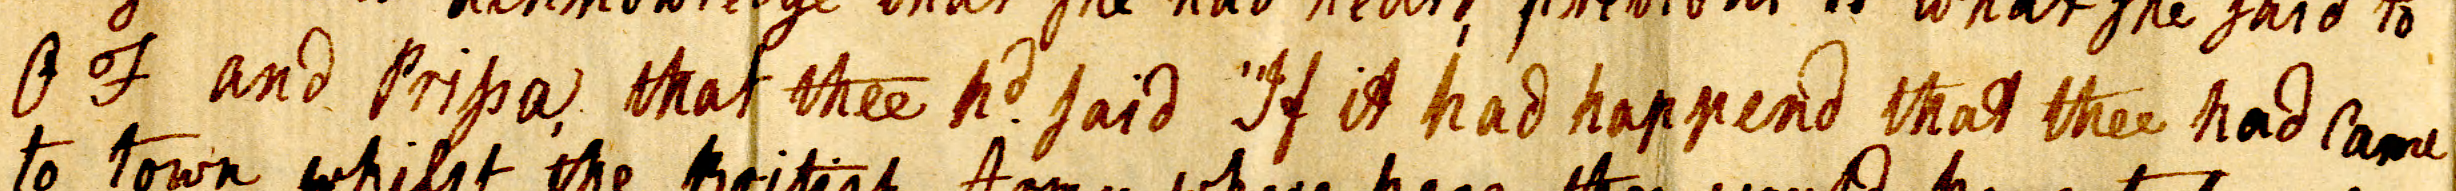O F and Prissa, that thee h^d. said "If it had happened that thee had came
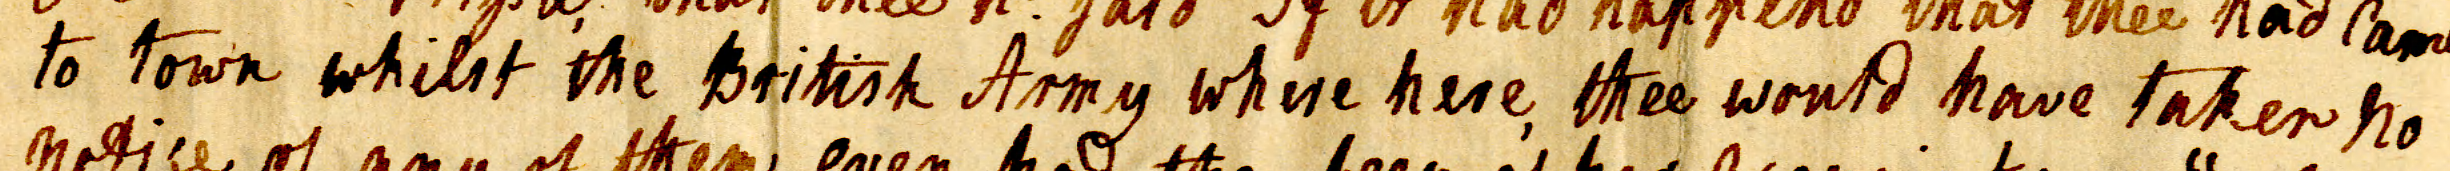to town whilst the British Army where here, thee would have taken no
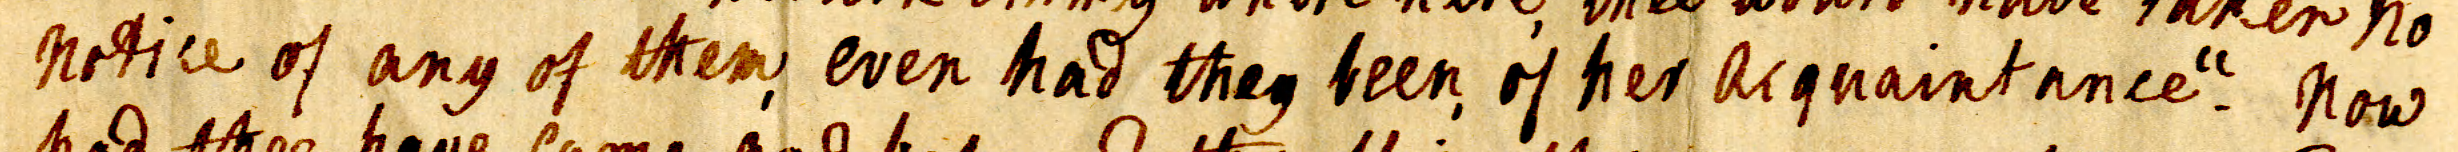notice of any them even had they been of her acquaintance." Now
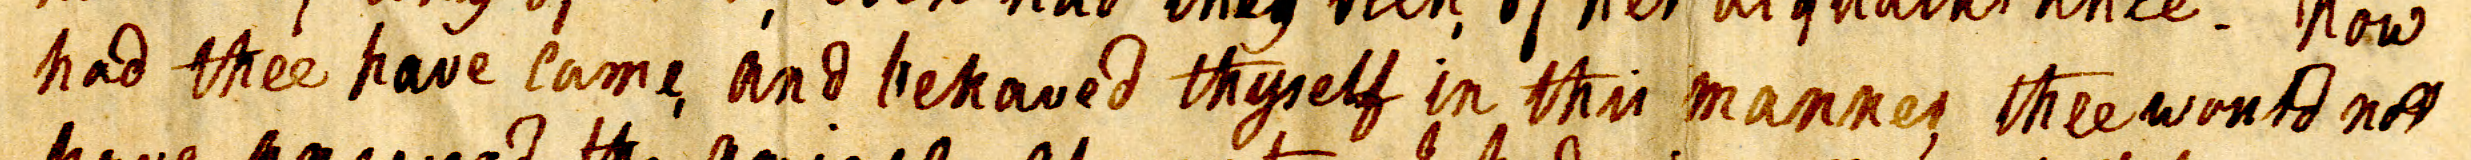had thee have came and behaved thyself in this manner, thee would not
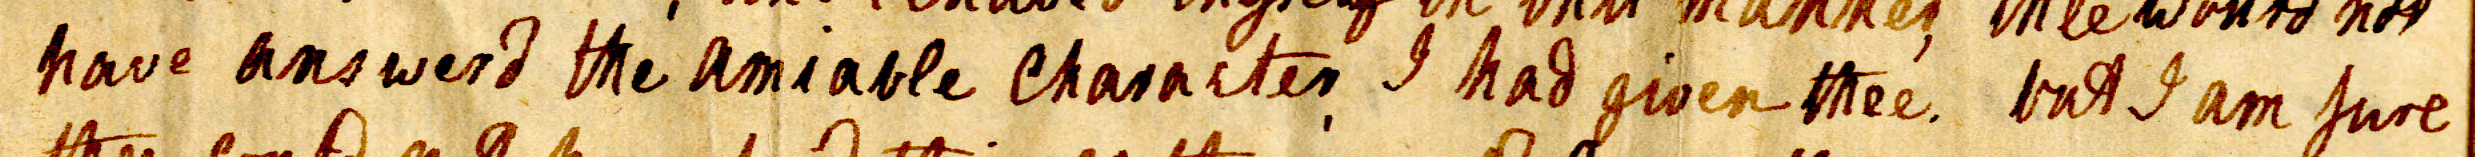have answerd the amiable character I had given thee. but I am sure
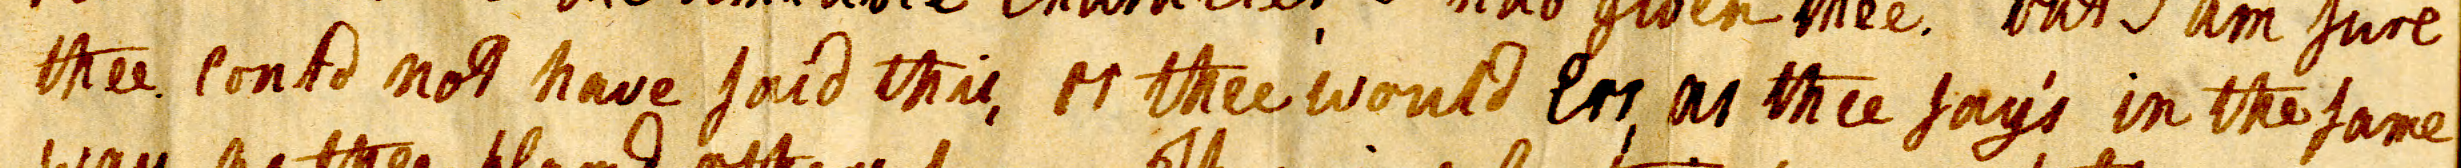thee could not have said this, or thee would Err, as thee say's in the same
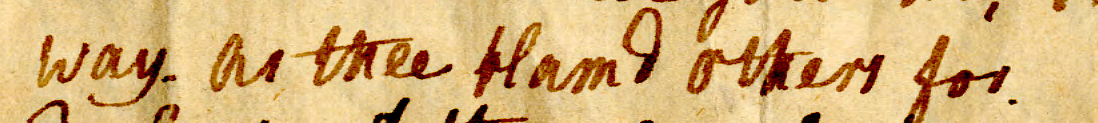way as thee blamd others for.
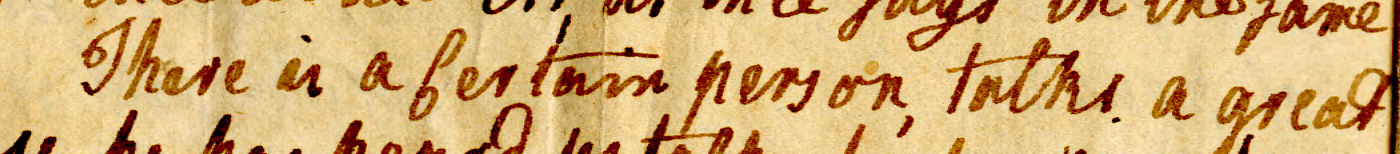There is a Certain person, talks a great
